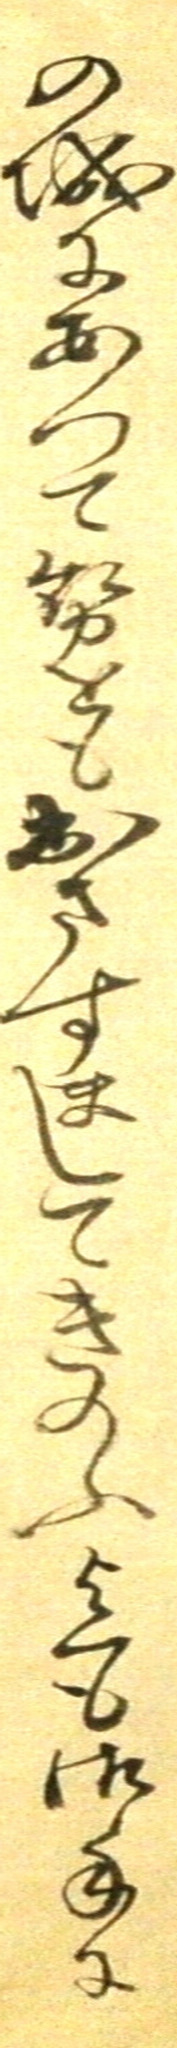の城にあつて勢を出さすましてきのふ迄も御手に
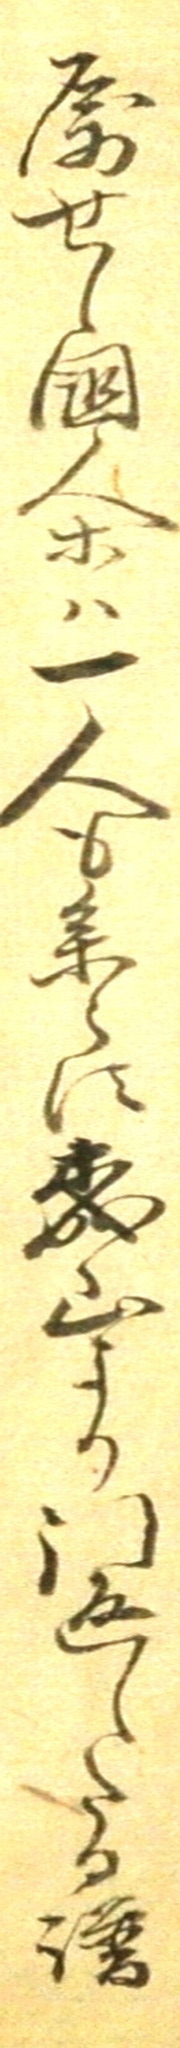属せし国人等は一人も参らす森山より引返したる譜
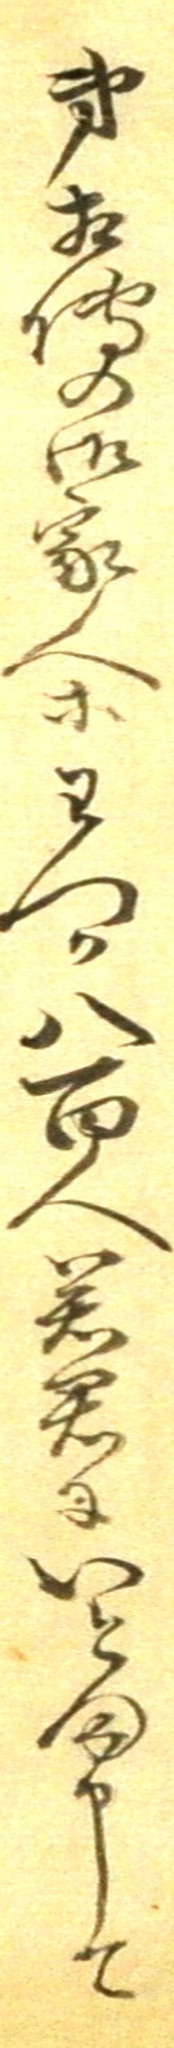第相伝の御家人等わつか八百人若君にいとま申て
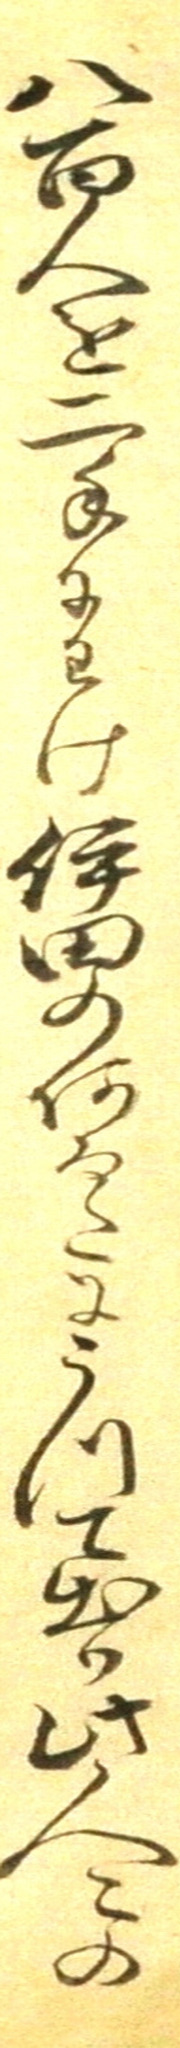八百人を二手にわけ伊田のあなたにうつて出る此人々の
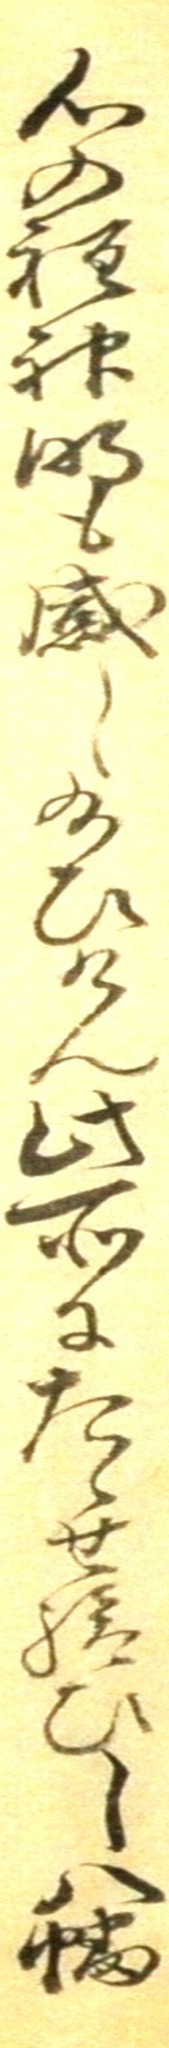心の程神明も感し給ひけん此所にたゝせ給ひし八幡
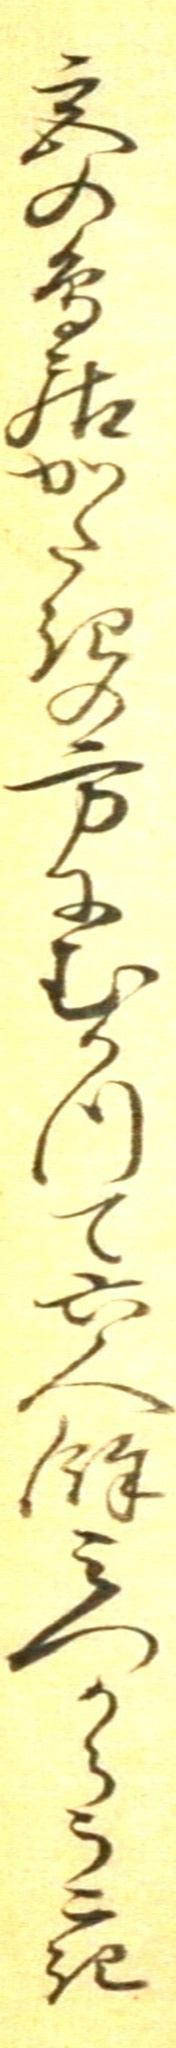宮の鳥居かたきの方にむかつて六人余みつからうこき
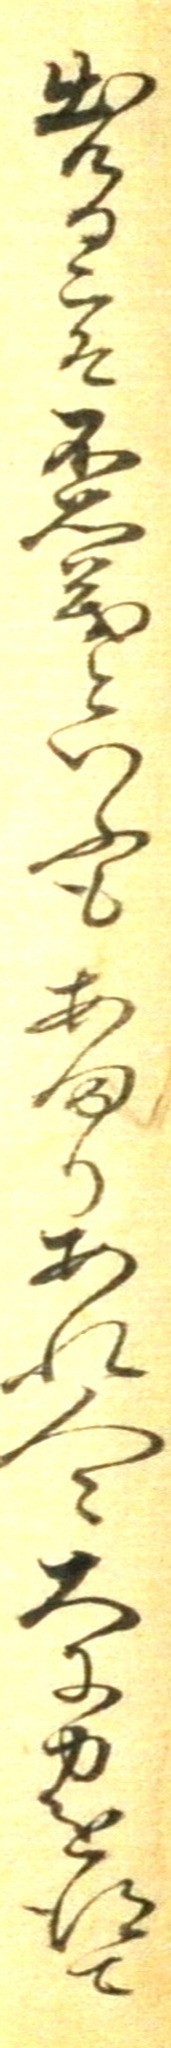出けるこそ不思義といふもあまりあれ人々大に力を得て
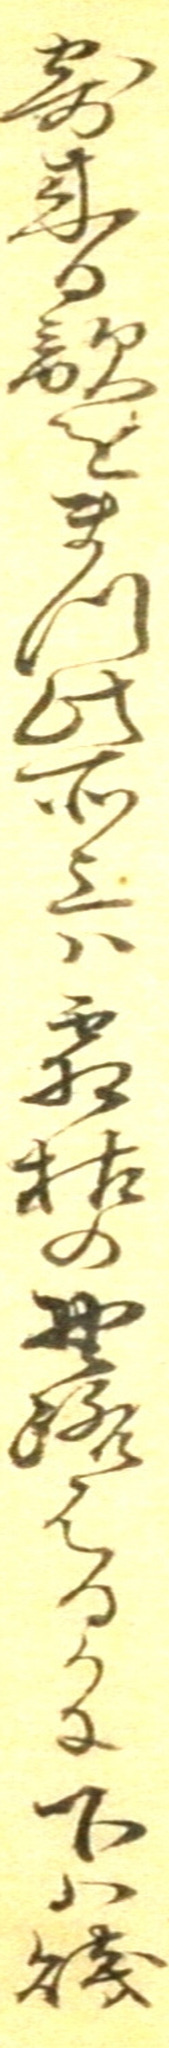寄来る敵をまつ此所上は霜枯の野路はるかに下は賤
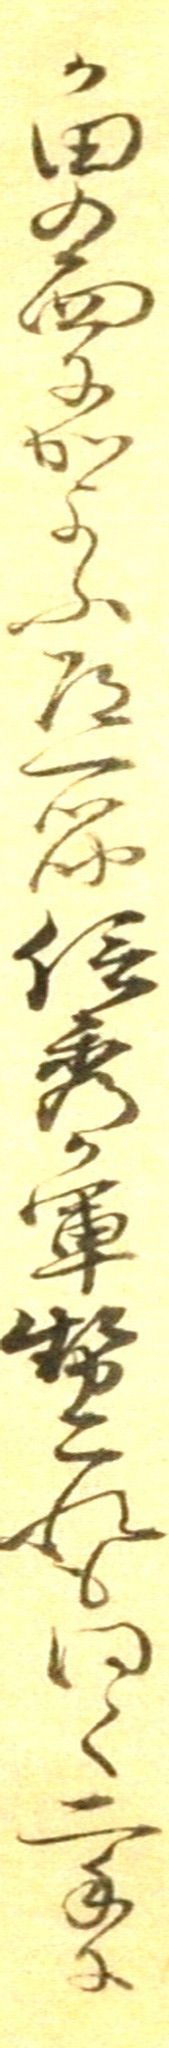か田の面にかよふ道一筋信秀か軍勢これも同く二手に
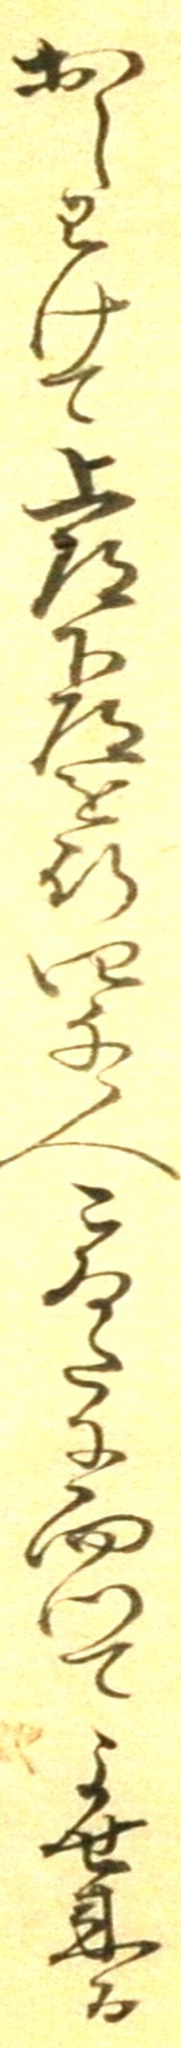おしわけて上道下道を行四千人こなたに向つてよせ来る
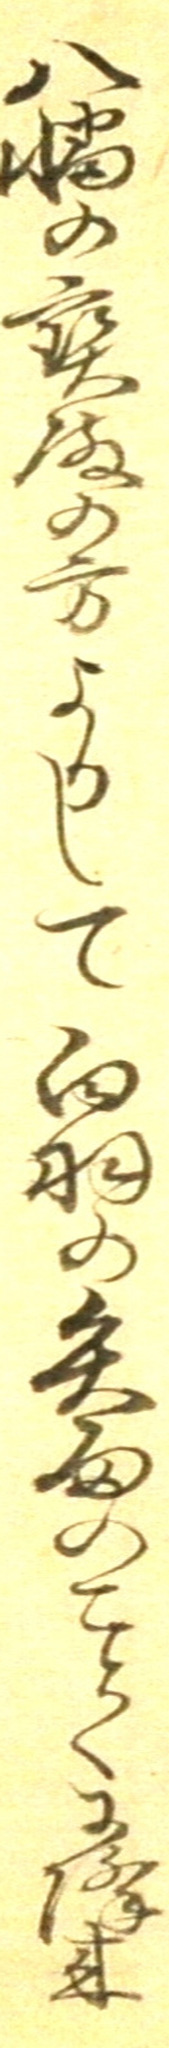八幡の宝殿の方よりして白羽の矢雨のことくに降来
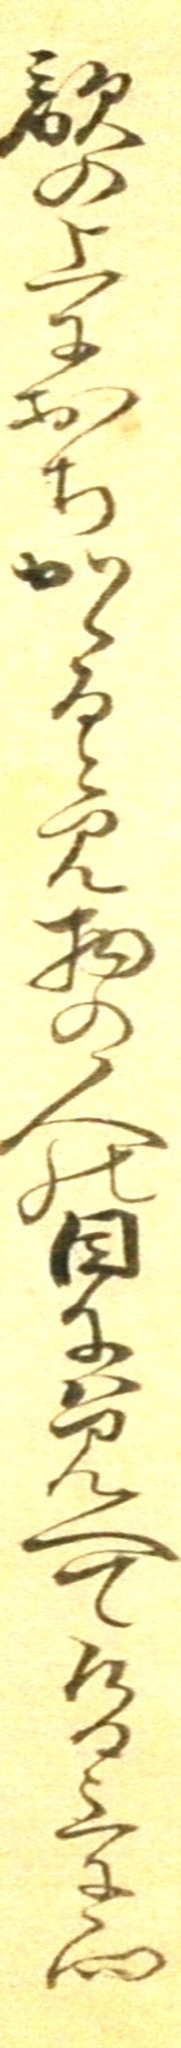敵の上におちかゝると見物の人の目には見へてける上に向
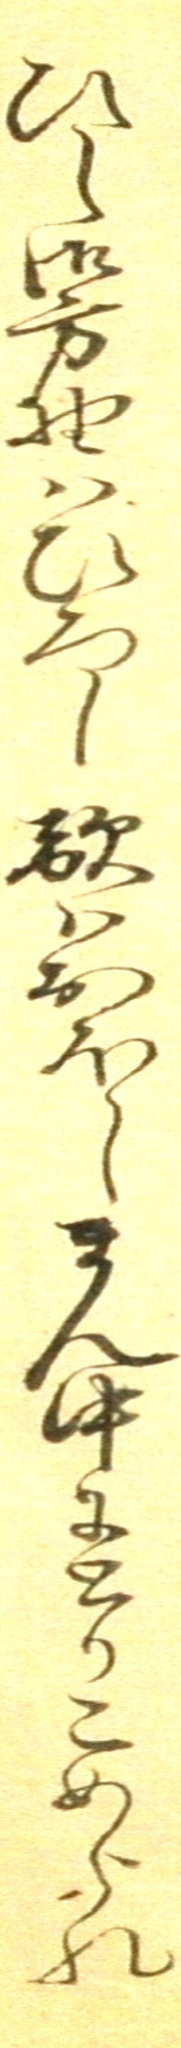ひし御方野はひろし敵はおほしまん中にとりこめられ
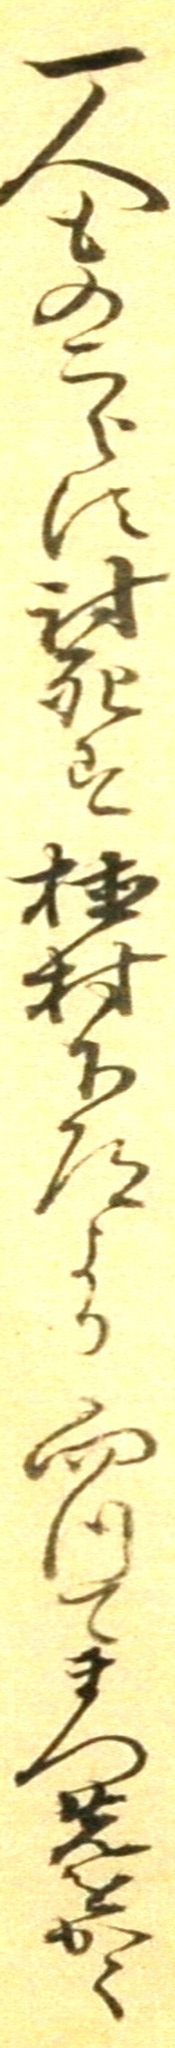一人ものこらす討死す植村下道より向つてまつ先をかく
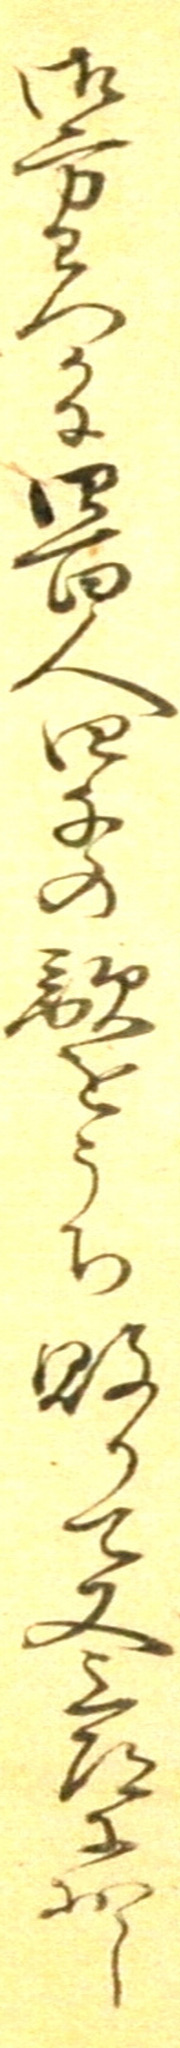御方わつかに四百人四千の敵をうち敗りて又上道におし
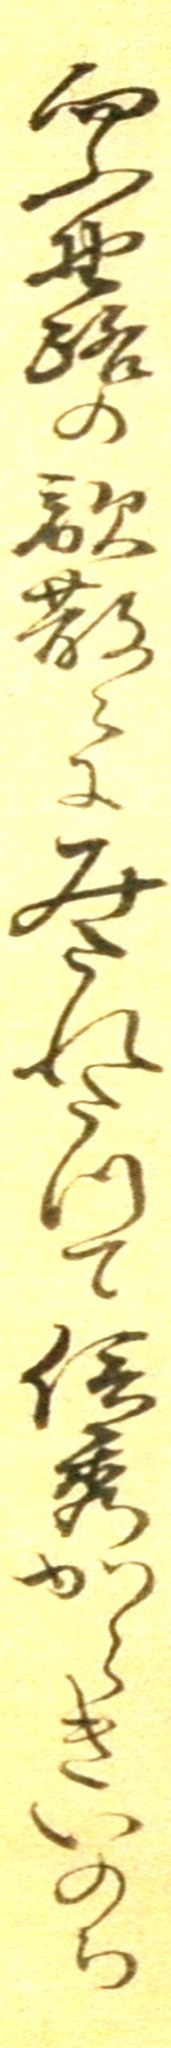向ふ野路の敵散々にみたれたつて信秀からきいのち
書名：藩翰譜（四・中）
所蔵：伊那市立高遠町図書館・合同会社AMANE
